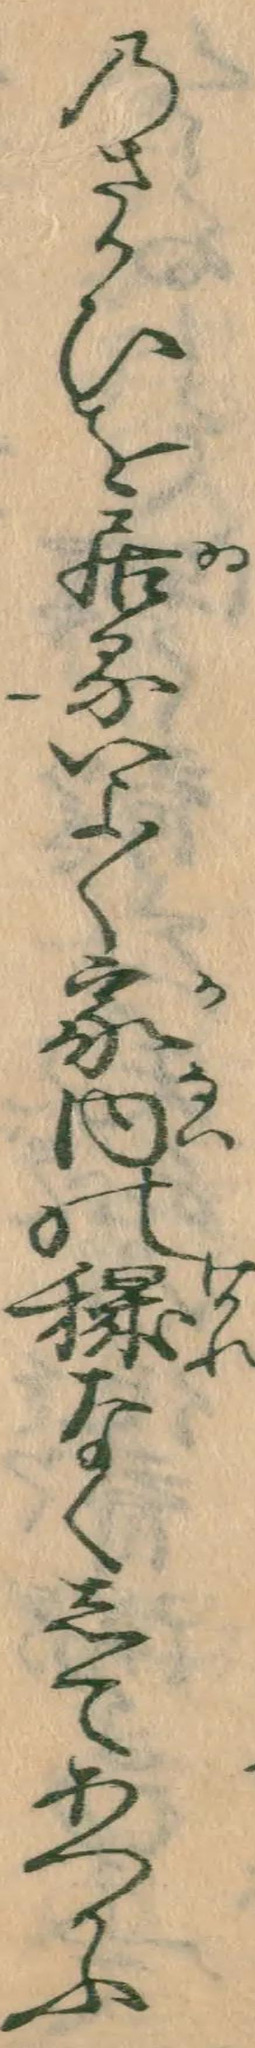のさかひを居るいよ〳〵家内の穢なくしてあつかふ
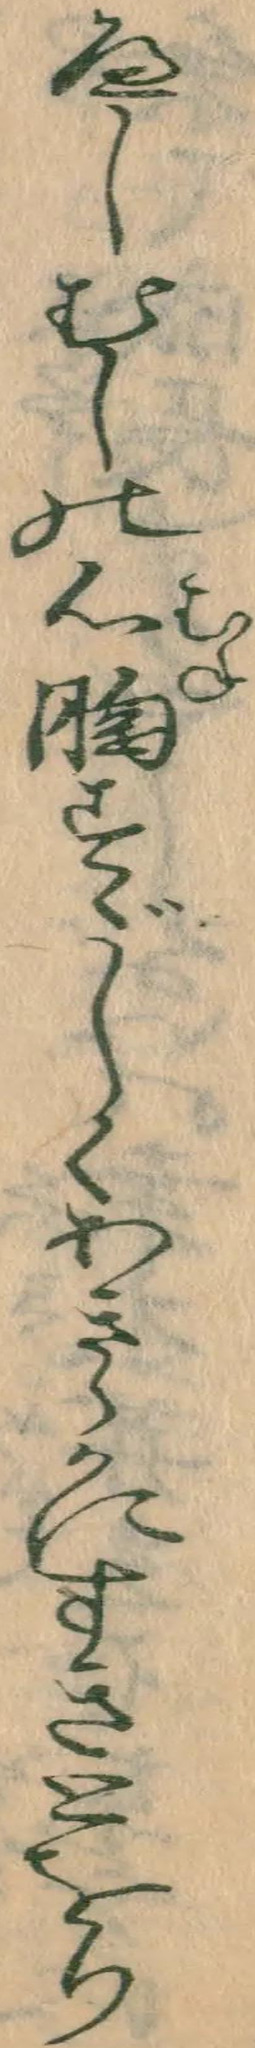へしむしの心胸すゞしくあきらかにすきとをり
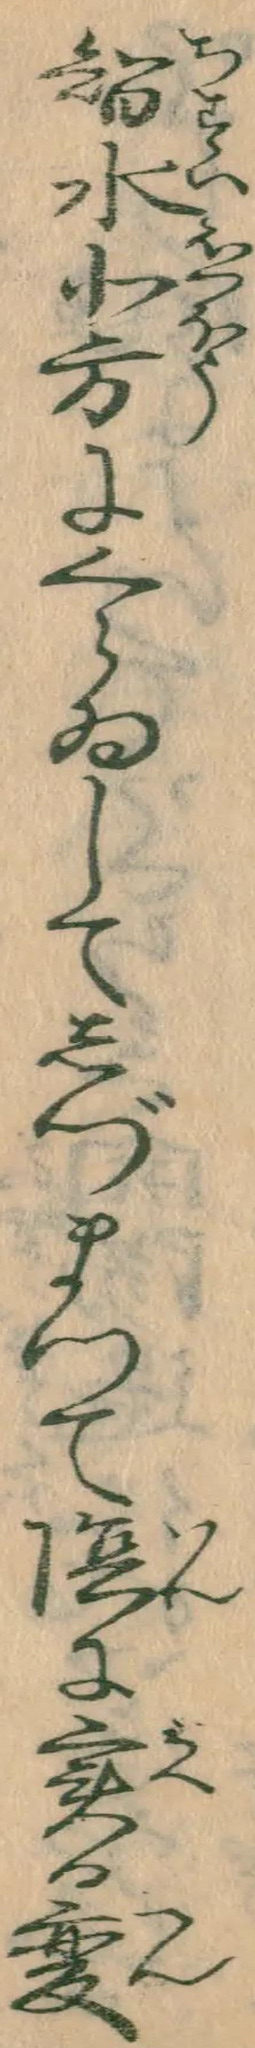智水北方にくらゐしてしづまつて陰に実る変
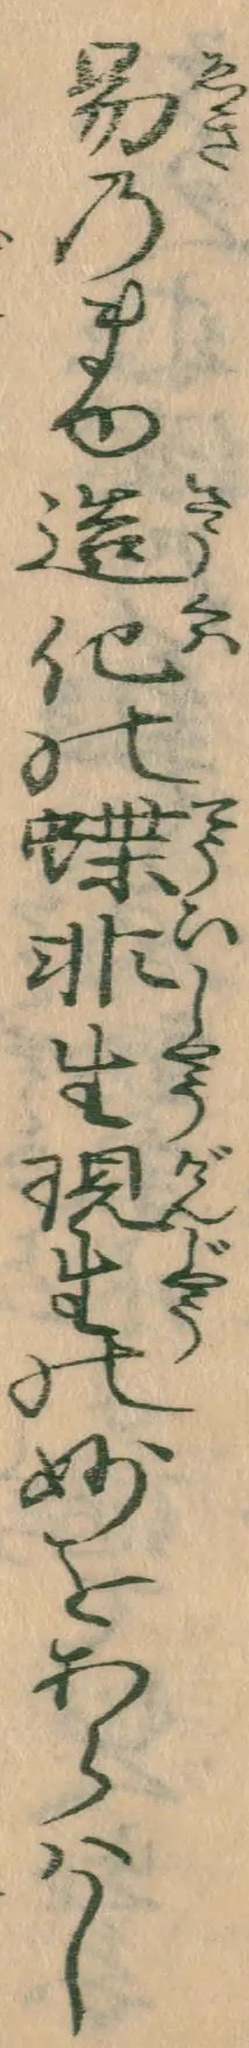易のまゆ造化の蝶非生現生の妙をあらはし
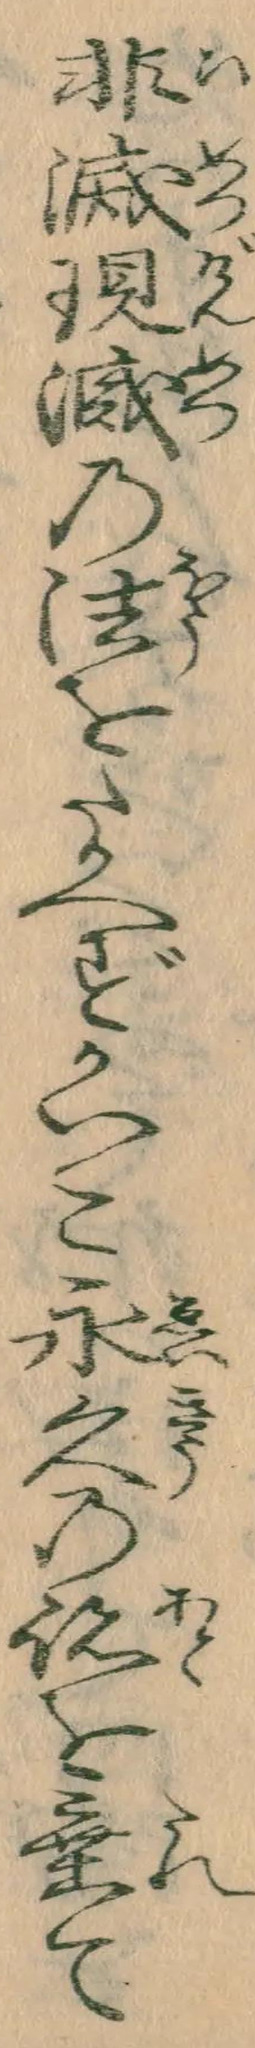非滅現滅の法をたかへずかいこ永久の跡を垂て
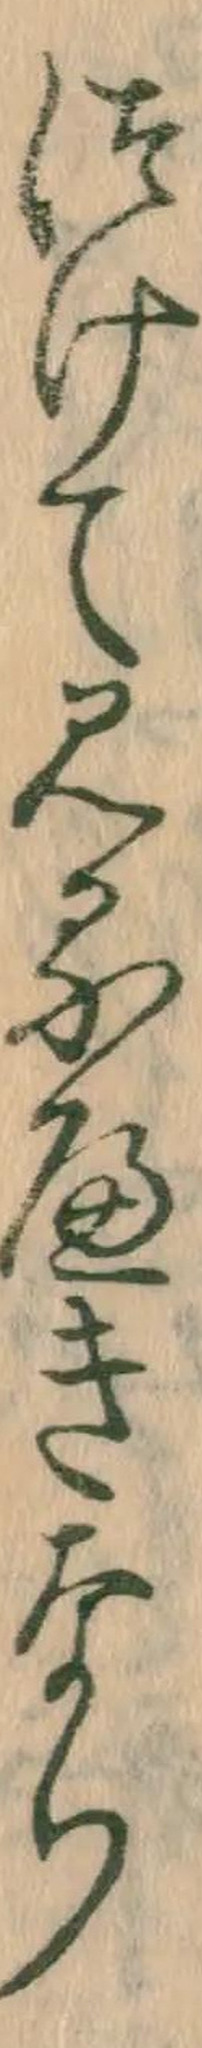つけて見るへきなり

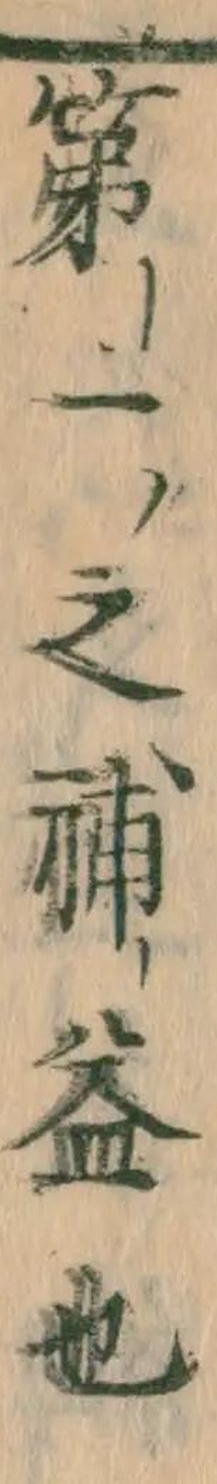第-一之補-益也
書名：蚕飼養法記
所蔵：国立国会図書館 National Diet Library, JAPAN
